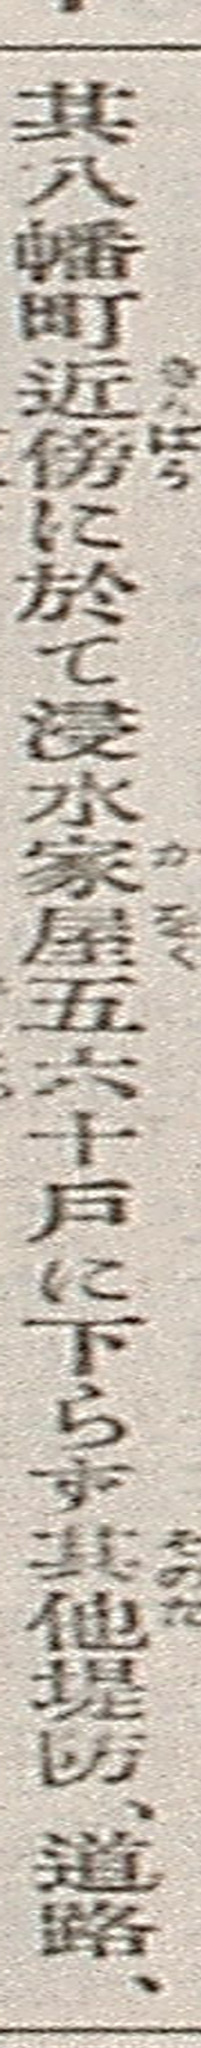其八幡町近傍に於て浸水家屋五六十戸に下らず其他堤防に氾濫
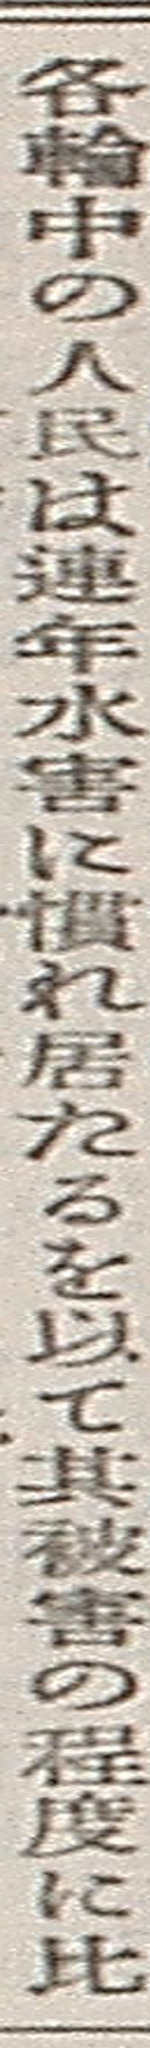各輪中の人民は連年水害に慣れ居たるを以て其被害の程度に比
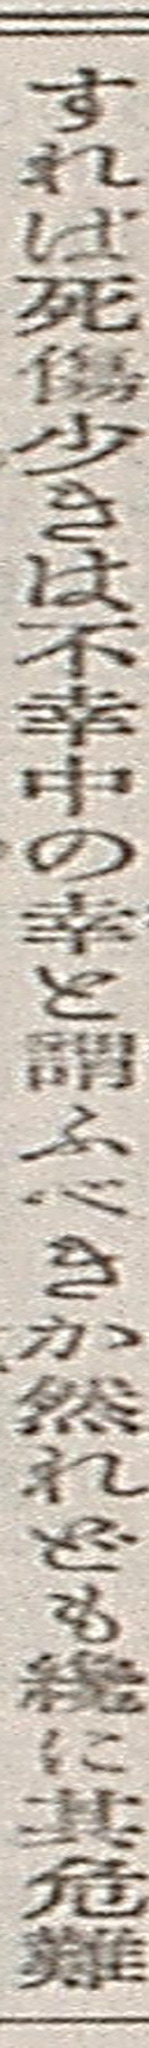すれば死傷少きは不幸中の幸と謂ふべきか然れども纔に其危難
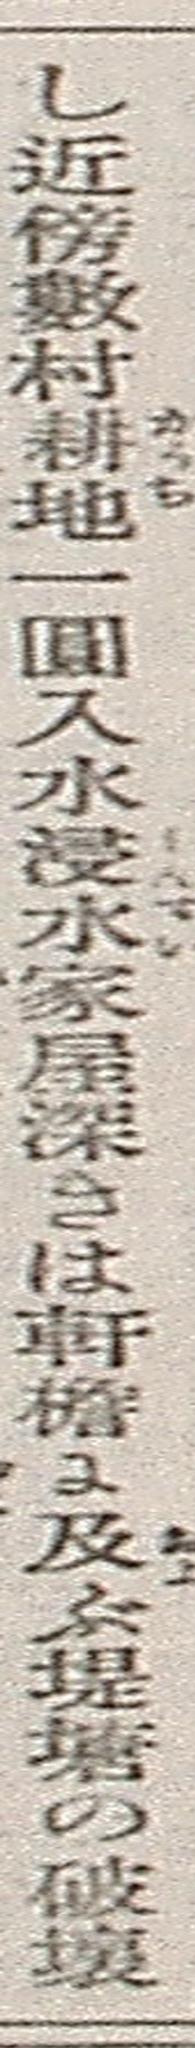し近傍数村耕地一円入水浸水家屋深さは軒擔に及ぶ堤塘の破壊
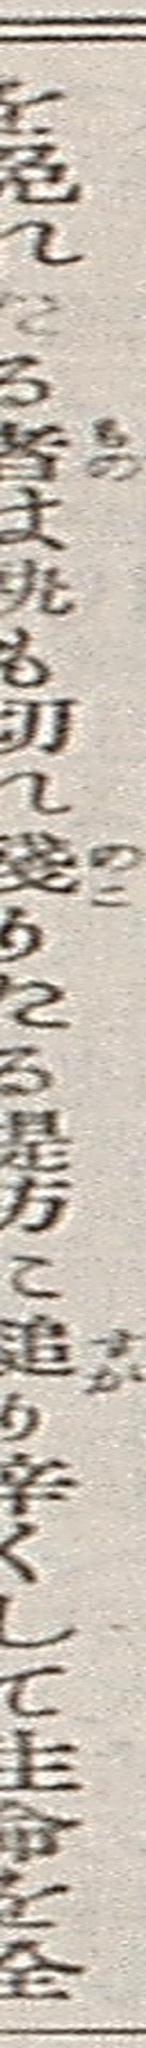を免れたる者は孰も切れ残りたる堤防に縋り辛くして生命を全
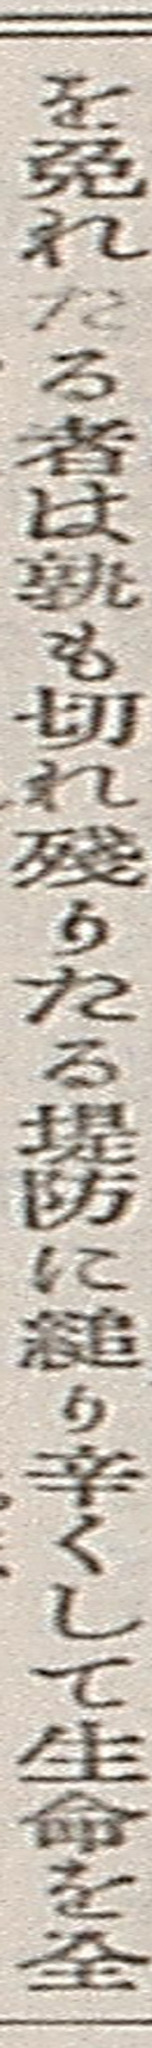を免れたる者は孰も切れ残りたる堤防に縋り辛くして生命を全
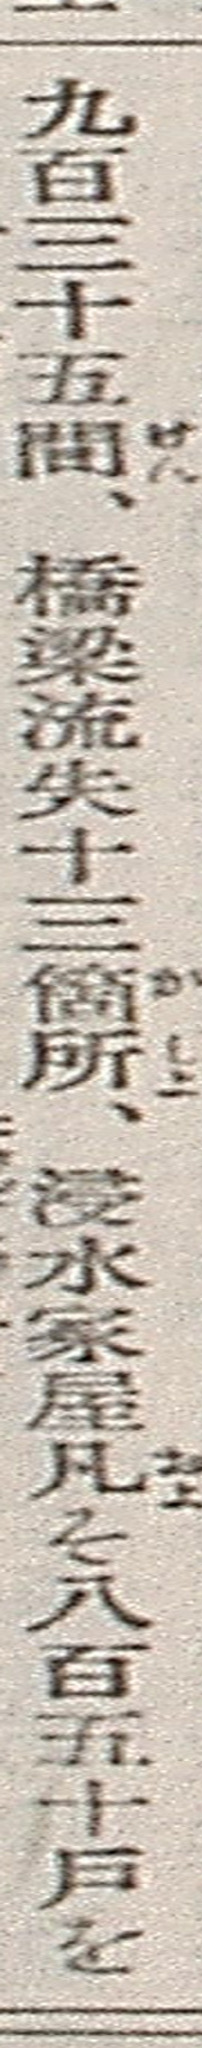九百三十五間、橋梁流失十三箇所、浸水家屋凡そ八百五十戸を
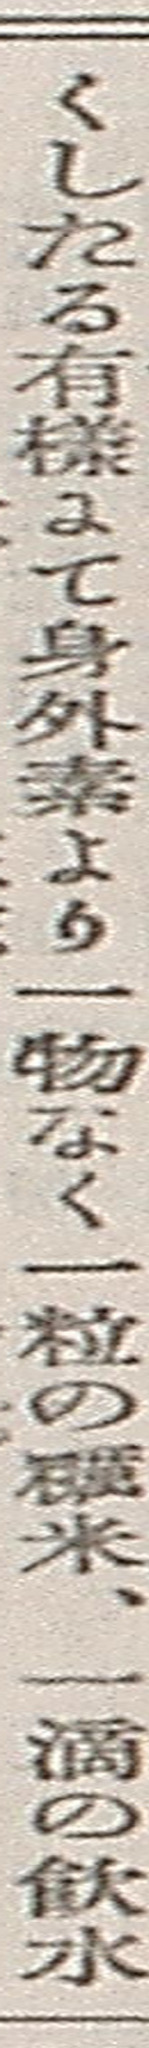くしたる有様にて身外素より一物なく一粒の糲米、一滴の飲水
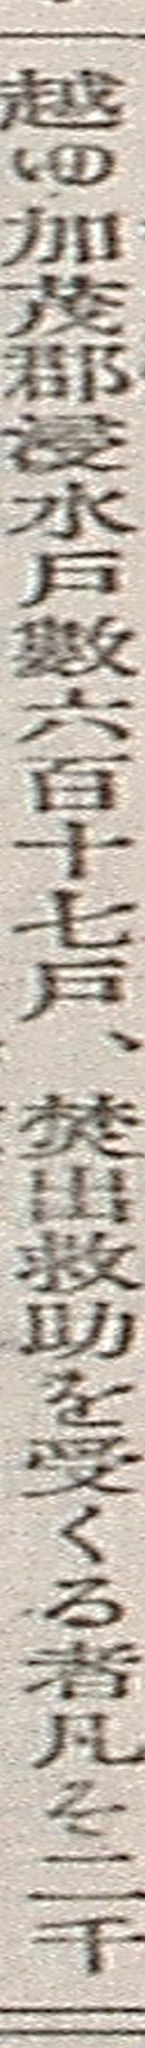越ゆ加茂郡浸水戸数六百十七戸、焚出救助を受くる者凡そ二千
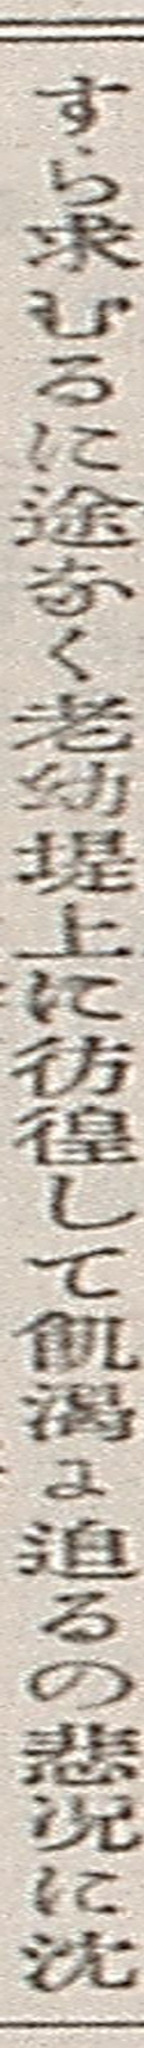すら求むるに途なく老幼堤上に彷徨して飢渇に迫るの悲況に沈
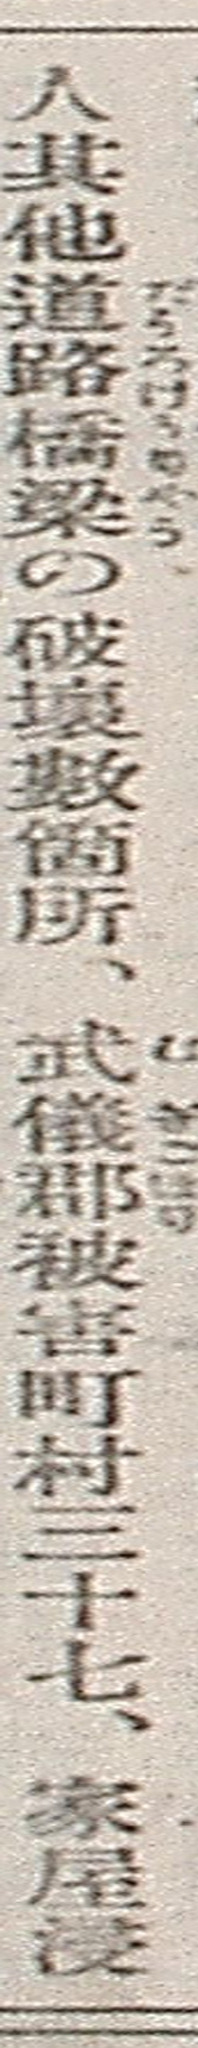人其他道路橋梁の破壊数箇所、武儀郡被害町村三十七、家屋浸
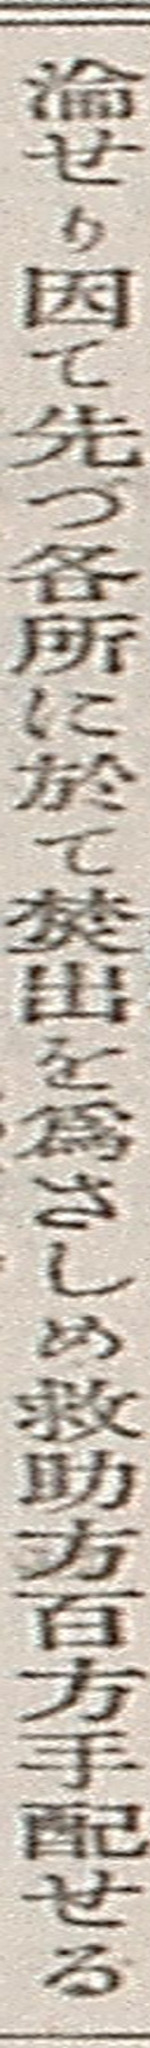淪せり因て先づ各所に於て焚出を為さしめ救助方百方手配せる
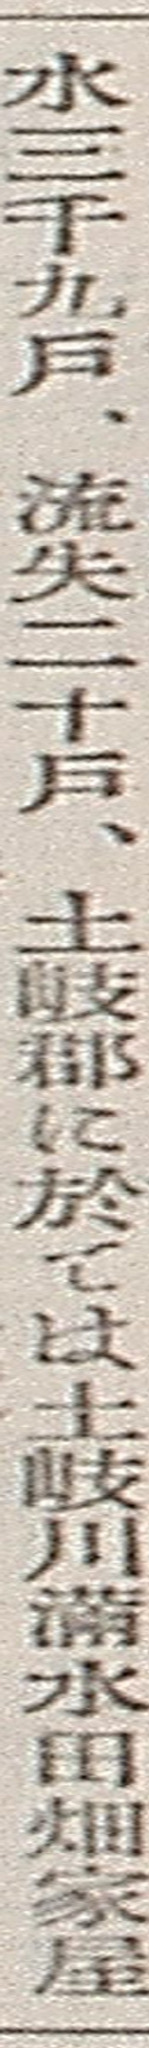水三千九戸、流失二十戸、土岐郡に於ては土岐川満水田畑家屋
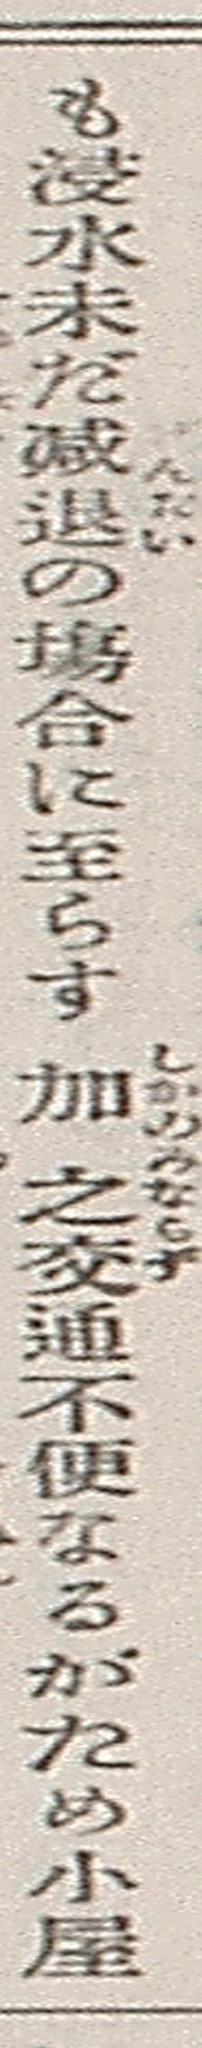も浸水未だ減退の場合に至らず加之交通不便なるがため小屋
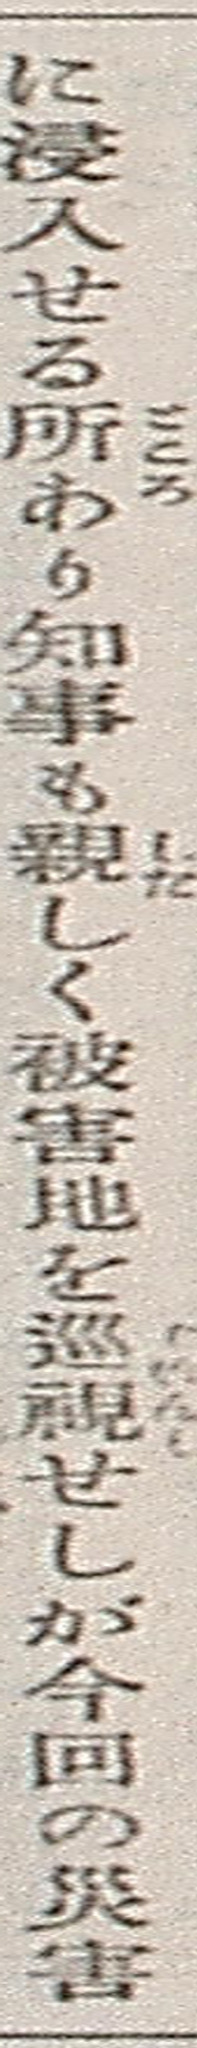に浸入せる所あり知事も親しく被害地を巡視せしが今回の災害
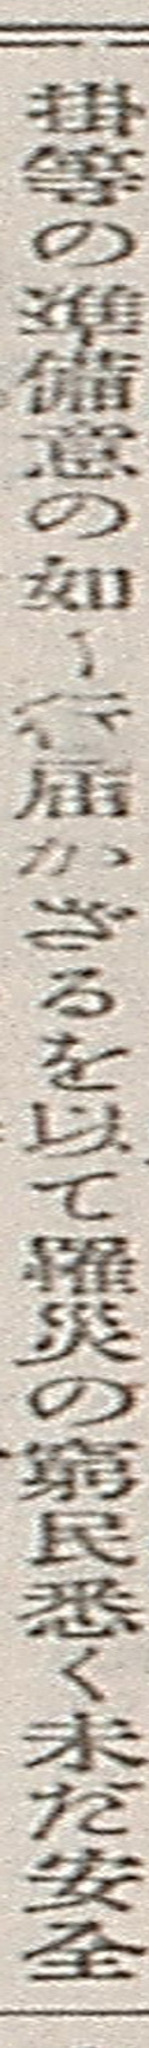掛等の準備意の如く行届かざるを以て罹災の窮民悉く未だ安全
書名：風俗畫報臨時増刊第百二十六號　洪水被害録（中）
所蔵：東京大学地震研究所図書室 Earthquake Research Institute Library, The University of Tokyo, JAPAN
